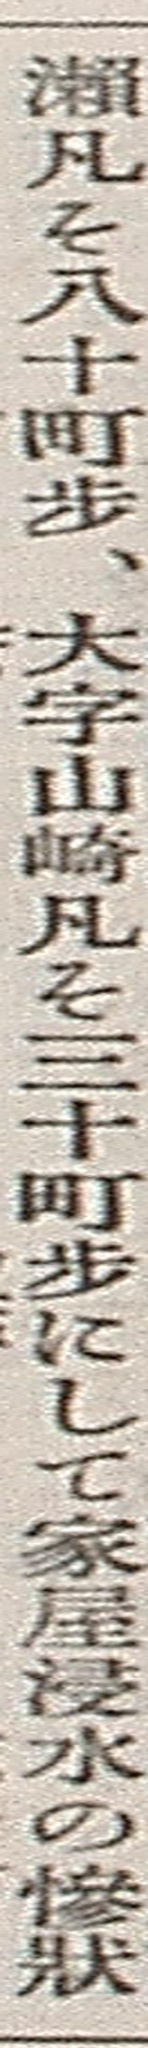瀬凡そ八十町歩、大字山崎凡そ三十町歩にして家屋浸水の惨状
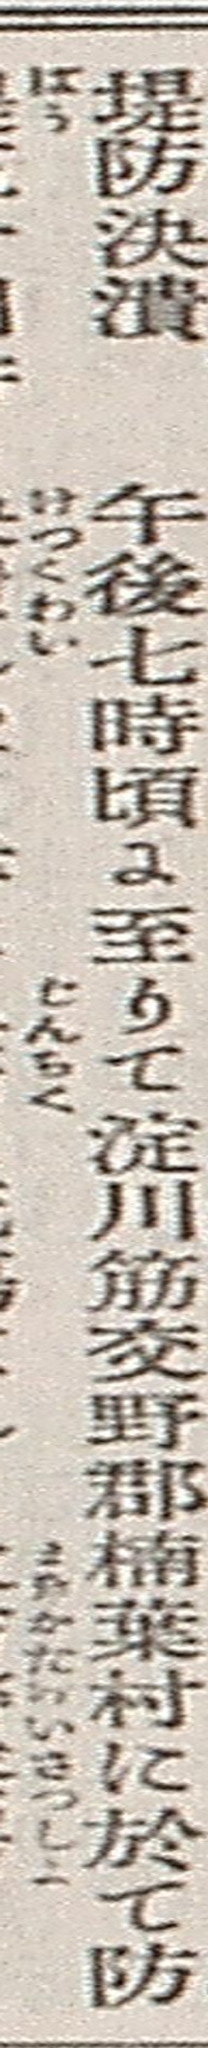堤防決潰午後七時頃に至りて淀川筋交野郡楠葉村に於て堤
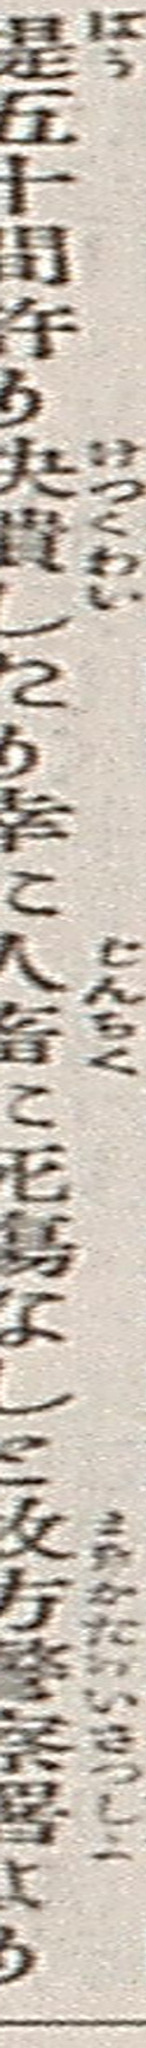防五十間許り決潰したり幸に人畜に死傷なしと牧方警察署より
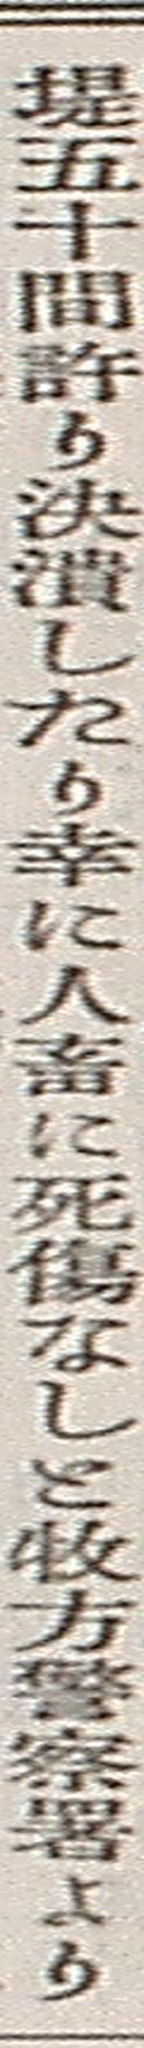防五十間許り決潰したり幸に人畜に死傷なしと牧方警察署より
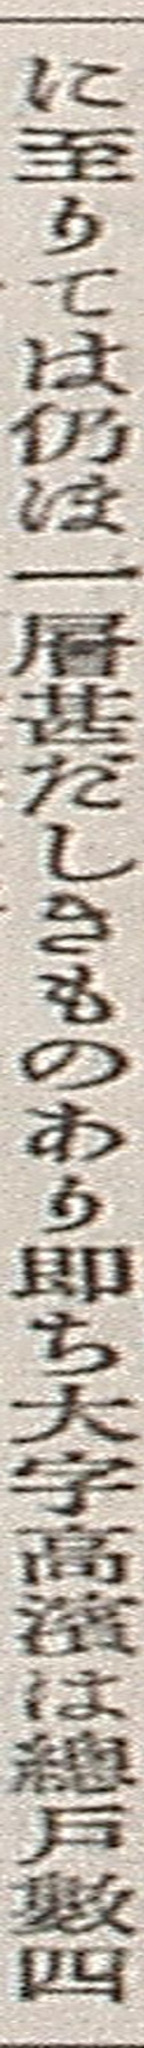に至りては仍ほ一層甚だしきものあり即ち大字高浜は総戸数四
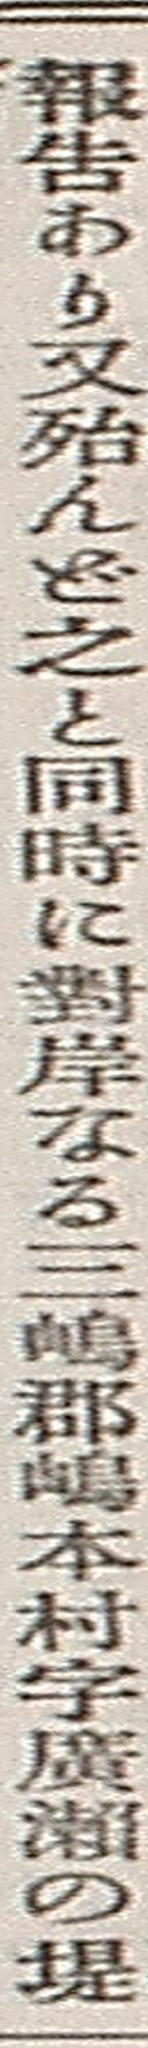報告あり又殆んど之と同時に対岸なる三嶋郡嶋本村字広瀬の堤
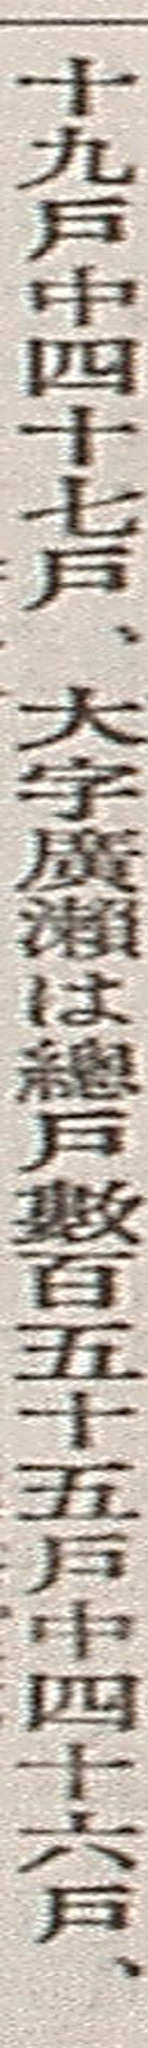十九戸中四十七戸、大字広瀬は総戸数百五十五戸中四十六戸、
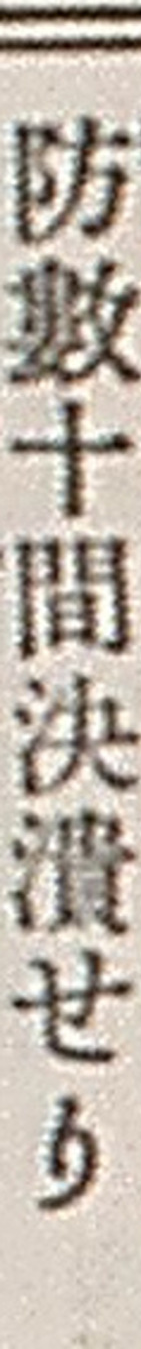防数十間決潰せり
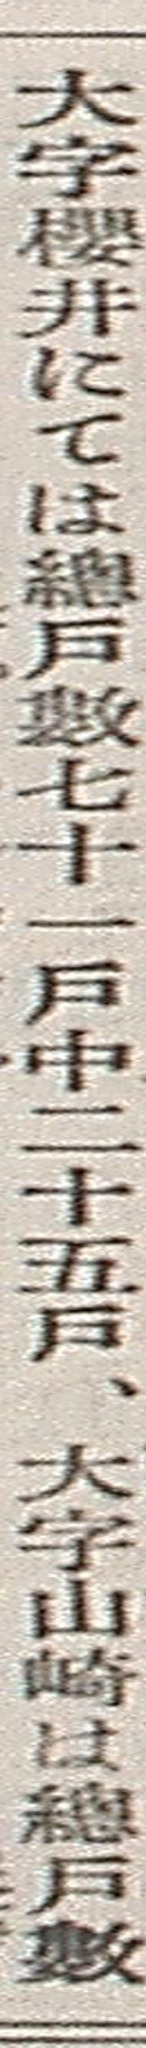大字桜井にては総戸数七十一戸中二十五戸、大字山崎は総戸数
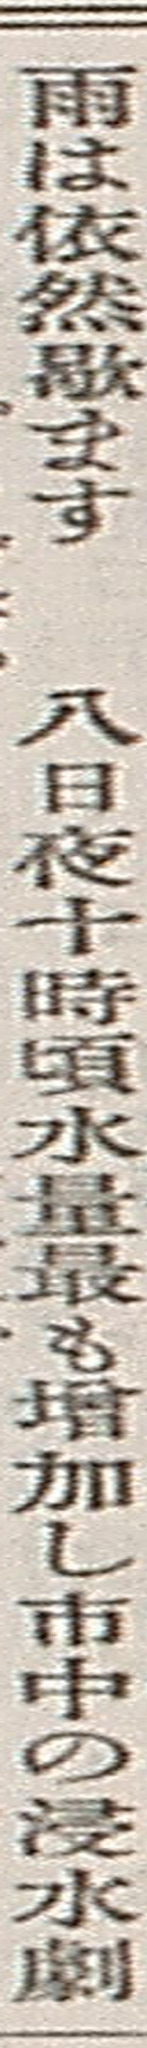雨は依然歇ます八日夜十時頃水量最も増加し市中の浸水劇
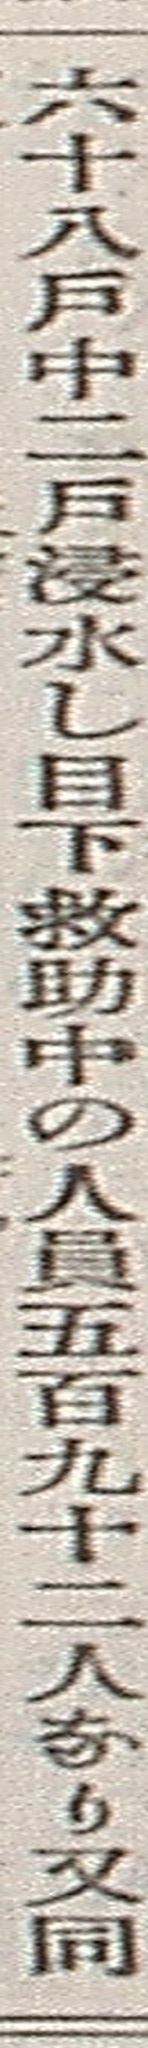六十八戸中二戸浸水し目下救助中の人員五百九十二人なり又同
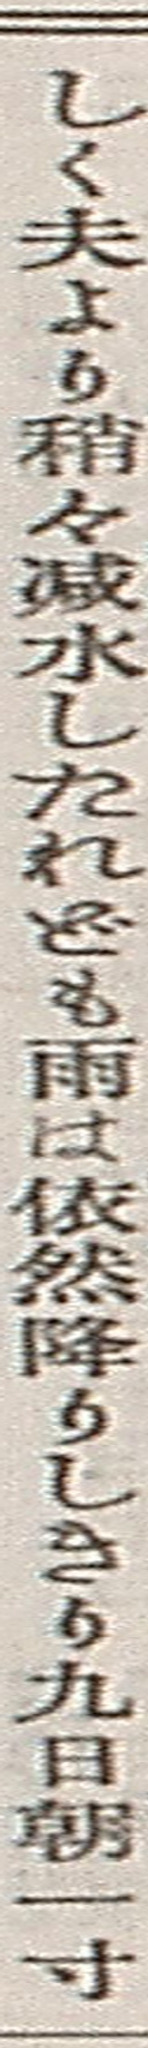しく夫より稍々減水したれども雨は依然降りしきり九日朝一寸
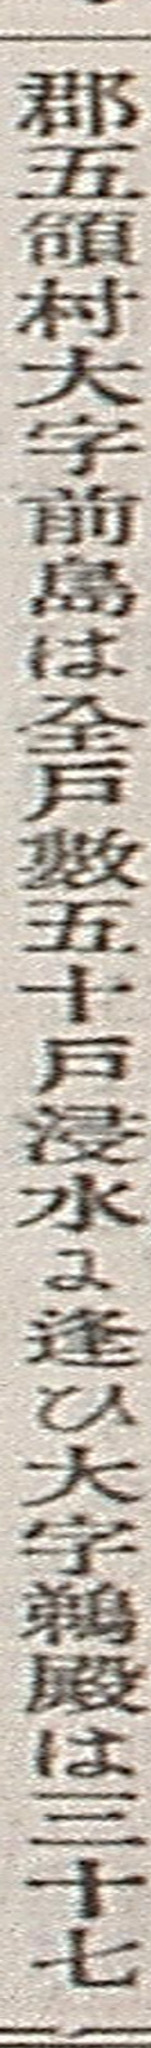郡五領村大字前島は全戸数五十戸浸水に逢ひ大字鵜殿は三十七

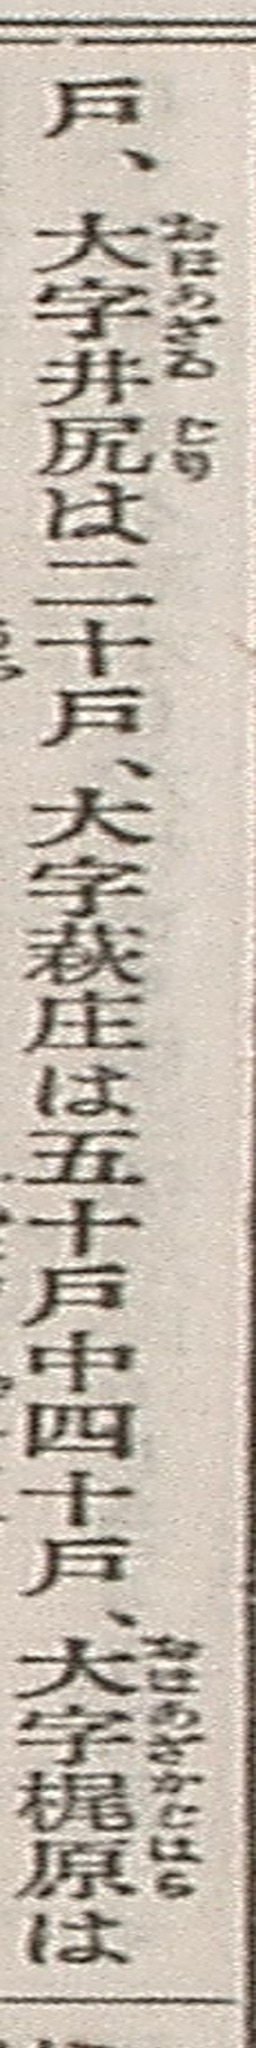戸、大字井尻は二十戸、大字萩庄は五十戸中四十戸、大字梶原は
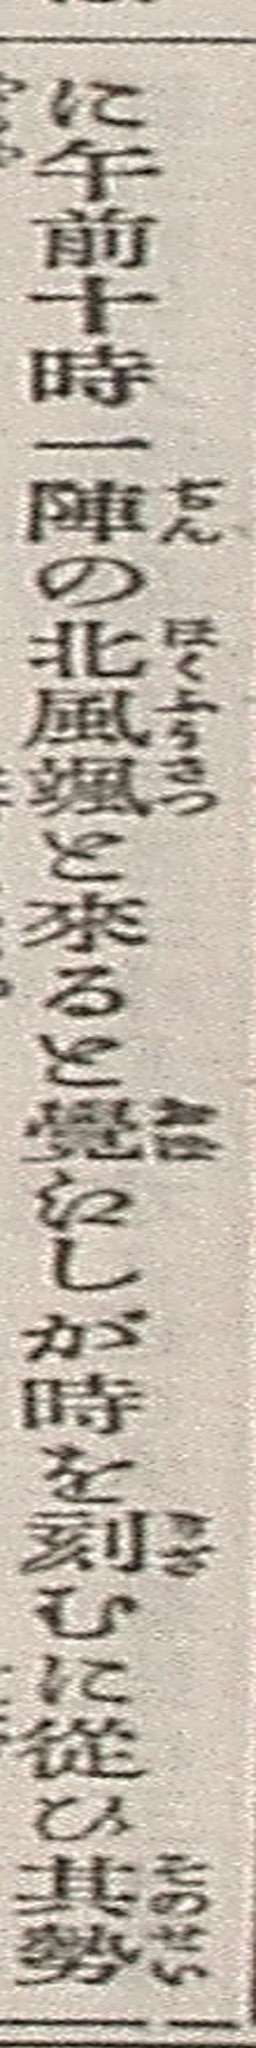に午前十時一陣の北風颯と來ると覚江しが時を刻むに従ひ其勢
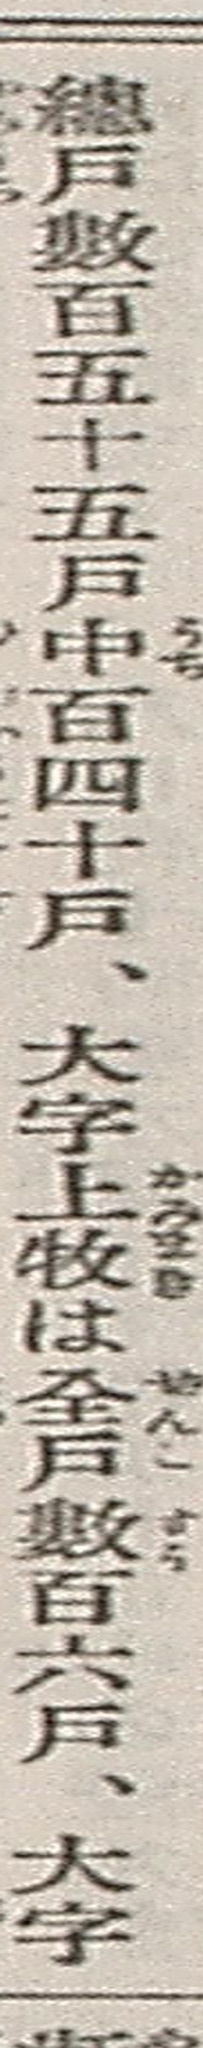総戸数百五十五戸中百四十戸、大字上牧は全戸数百六戸、大字
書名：風俗畫報臨時増刊第百二十八號　洪水被害録（下）
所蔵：東京大学地震研究所図書室 Earthquake Research Institute Library, The University of Tokyo, JAPAN
